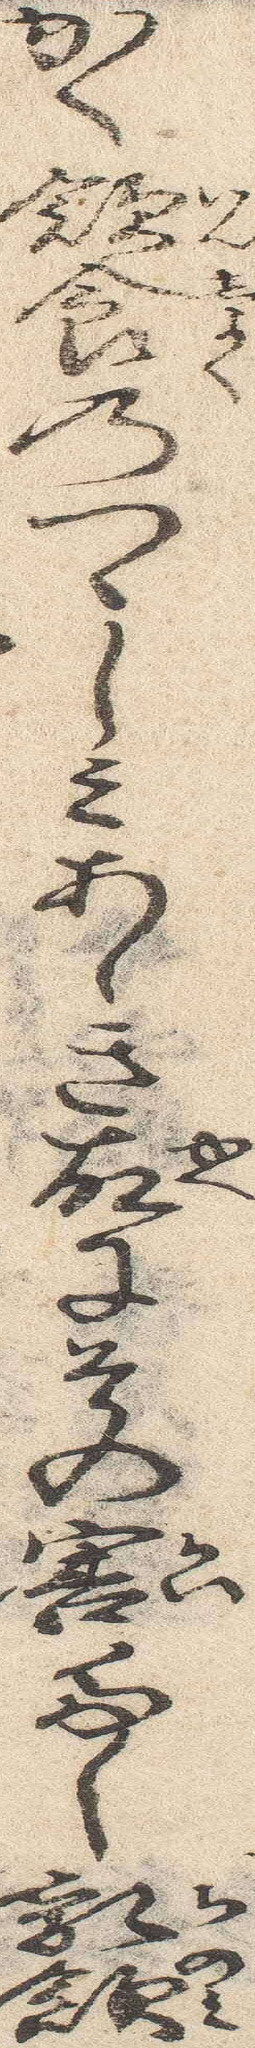かく飲食のつゝしみあしき故にその害多し乳飲
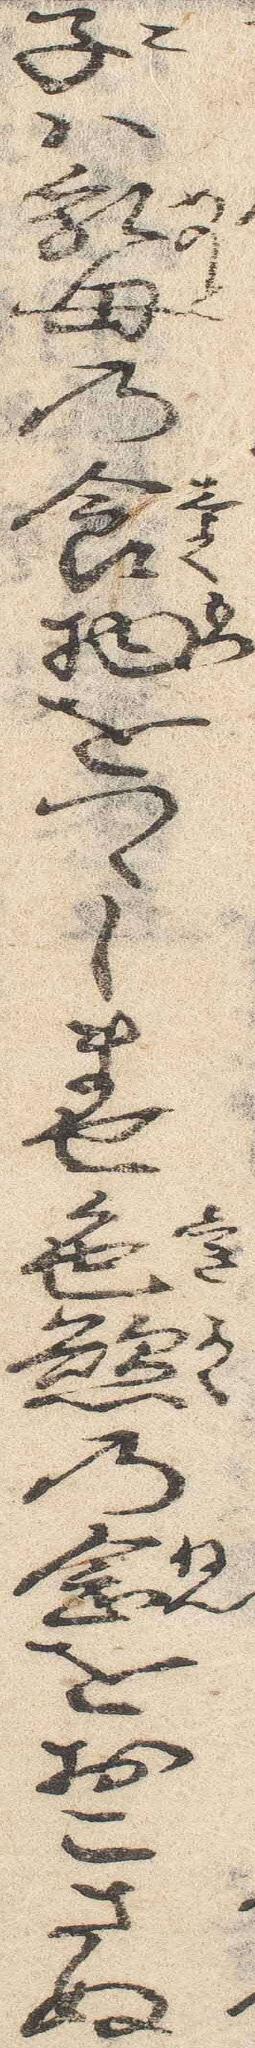子は乳母の食物をつゝしませ色欲の念をおこさぬ
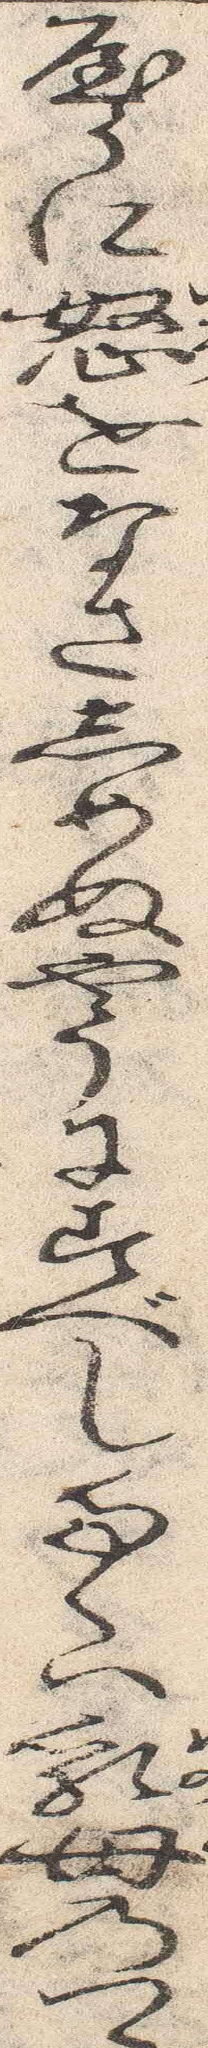やうに怒をなさしめぬやうにすべし多くは乳母のつゝ
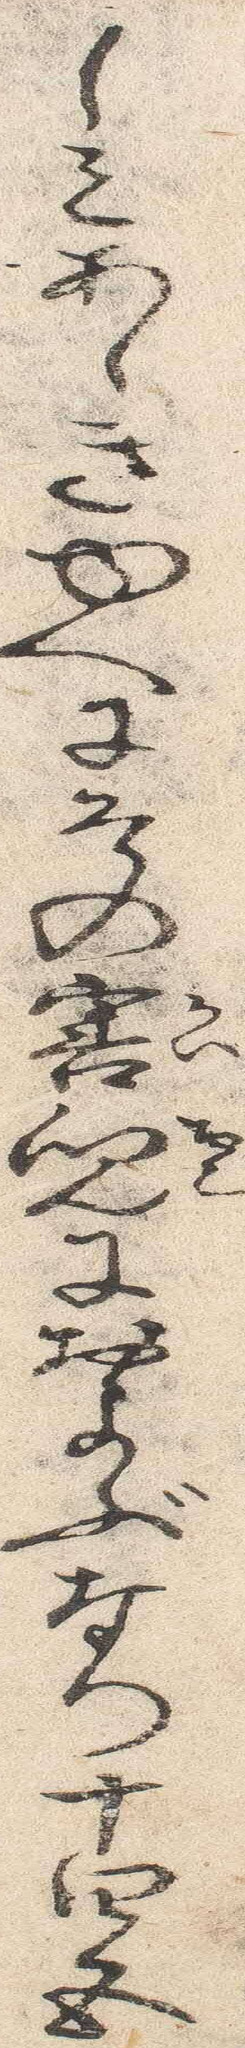しみあしきゆへにその害児におよぶなり十四五
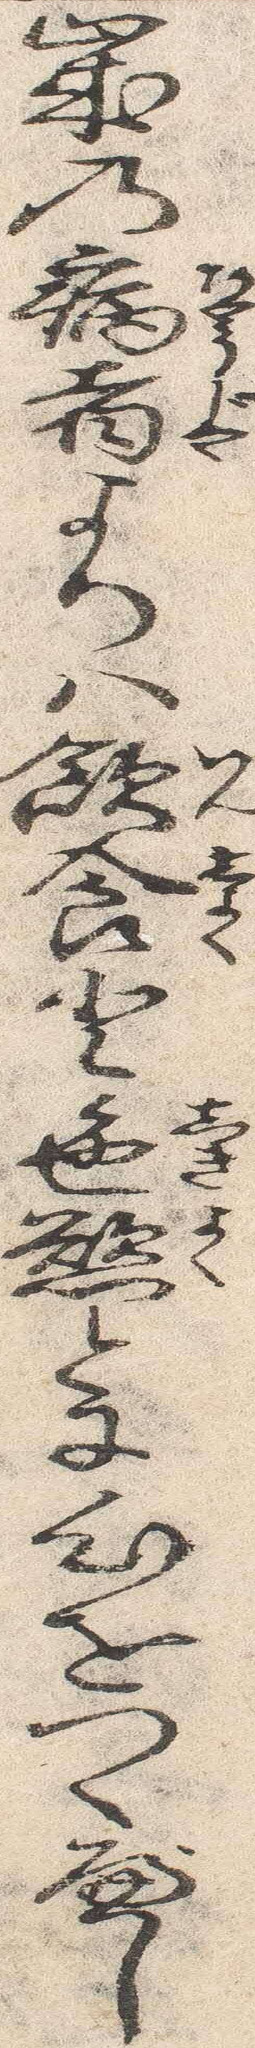歳の病者よりは飲食と色欲とに心をつくべし
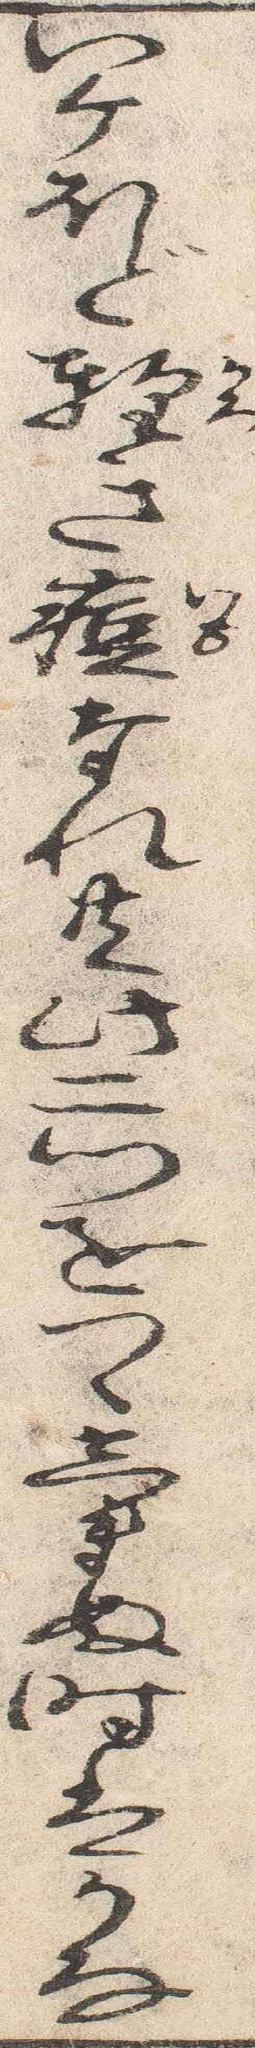いケほど軽き痘なれ共此二ツをつゝしまぬ時はかな
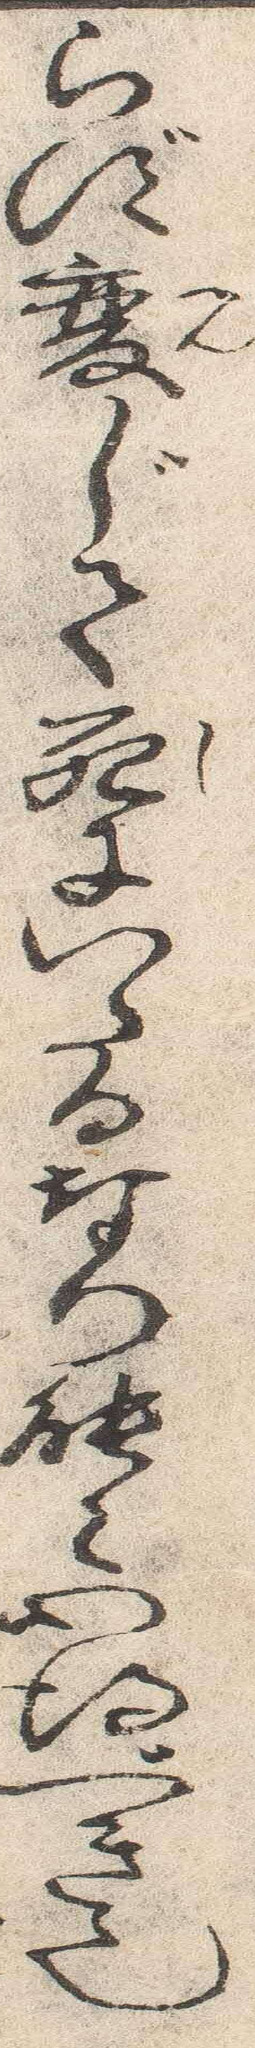らず変じて死にいたるなり能々心得べき也
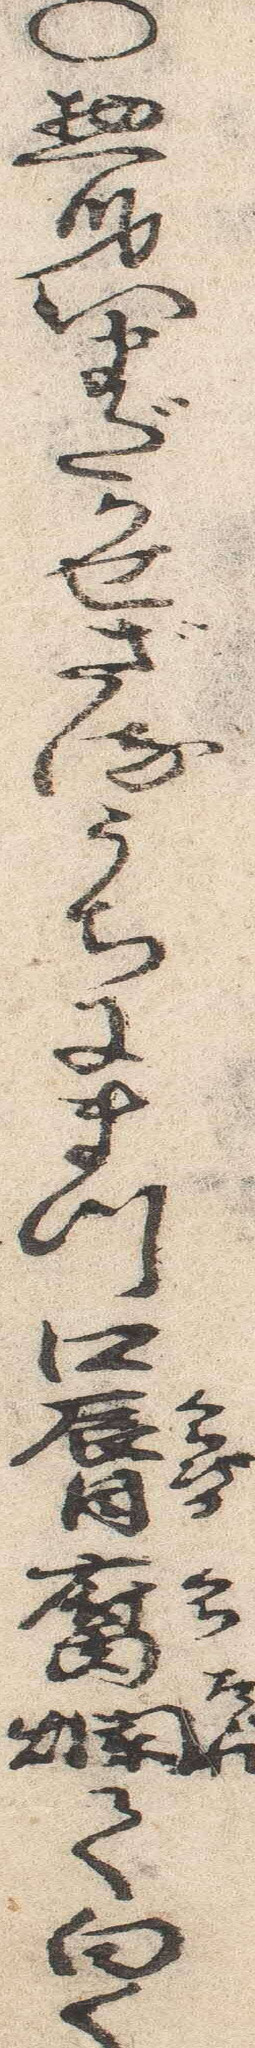○総身いまだかせざるうちにまつ口唇腐爛て白く
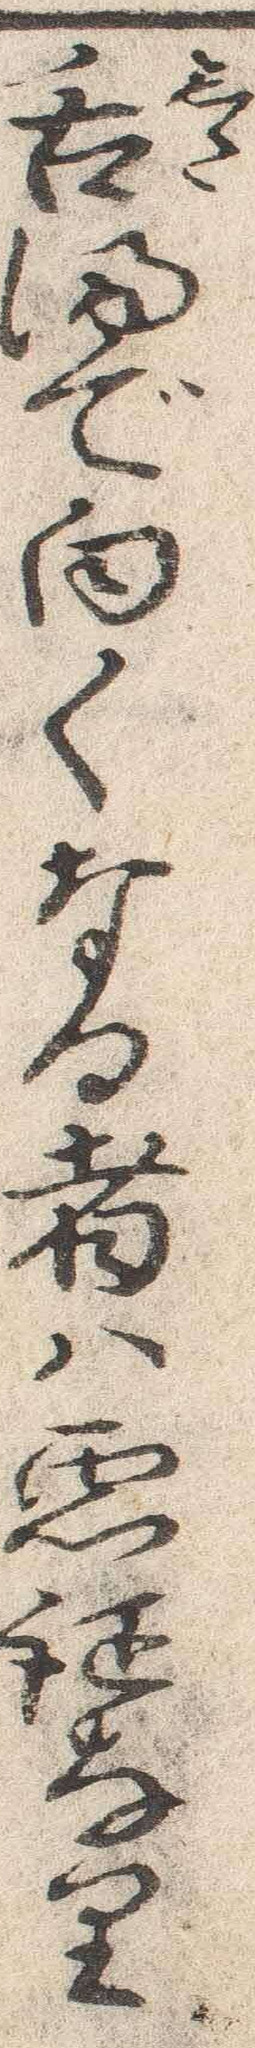舌まで白くなる者は悪証なり
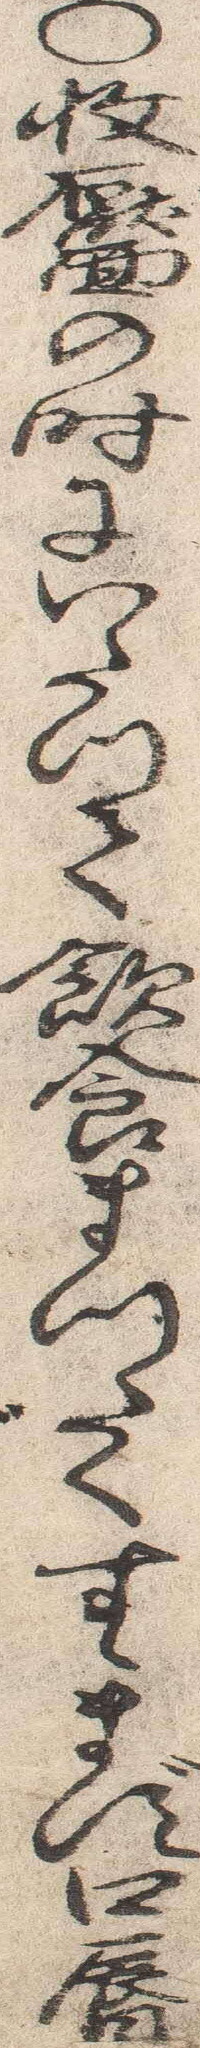○収靨の時にいたつて飲食まつたくすゝまず口唇
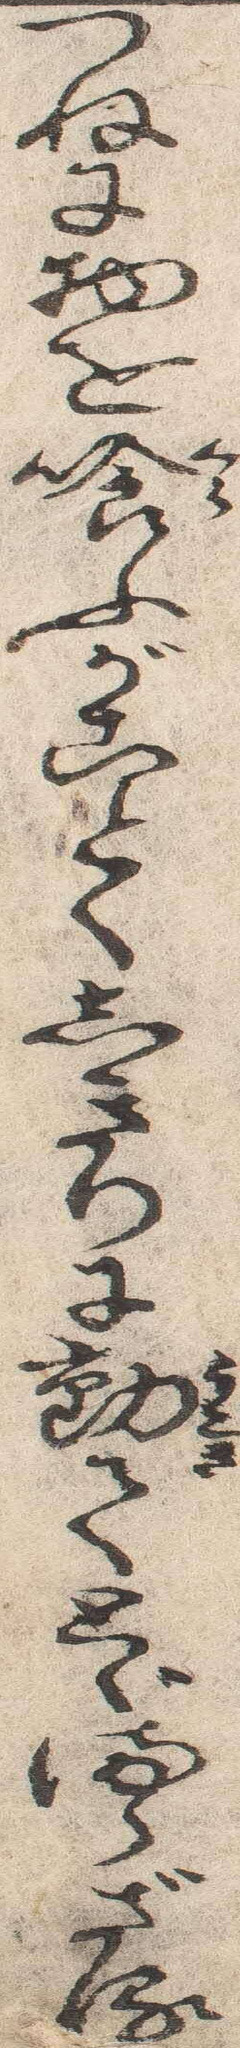つねに物を喰ふがことくしきりに動てとゞまらざる
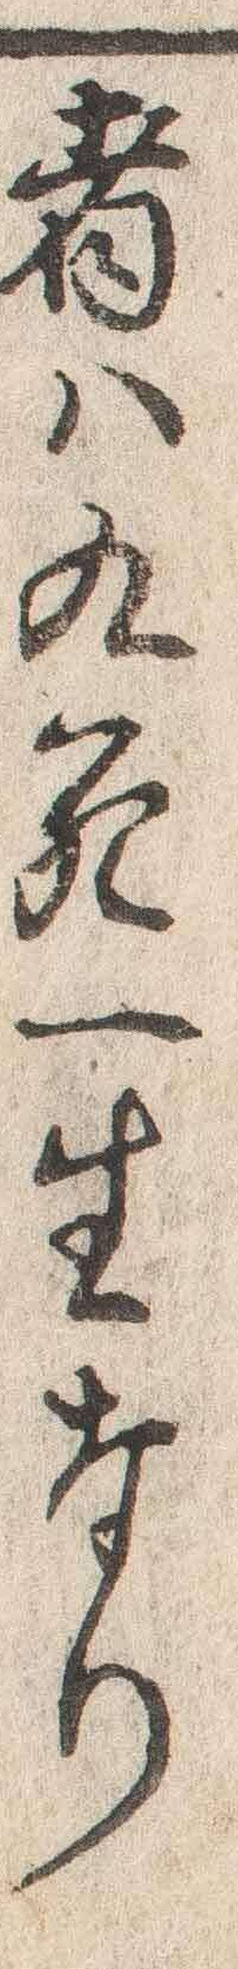者は九死一生なり
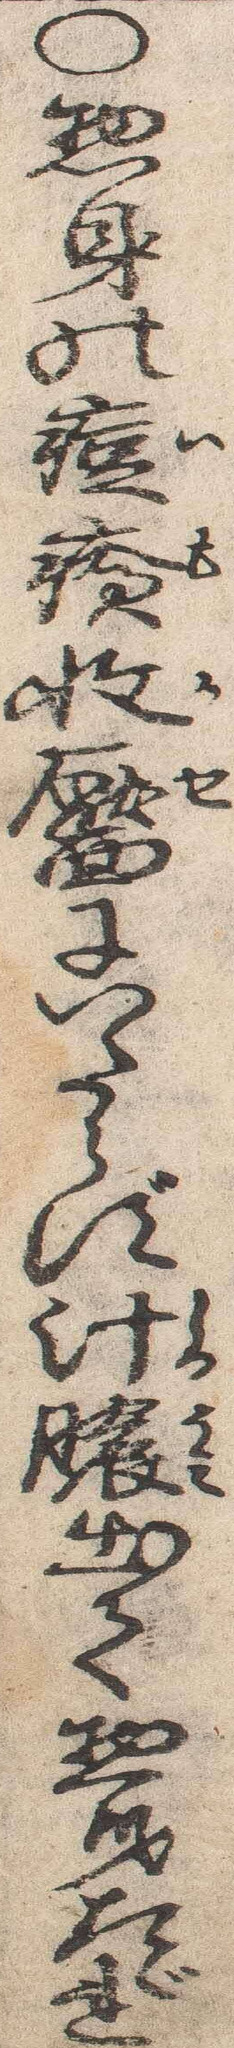○総身の痘瘡収靨にいたらず汁膿出て総身たゞれ

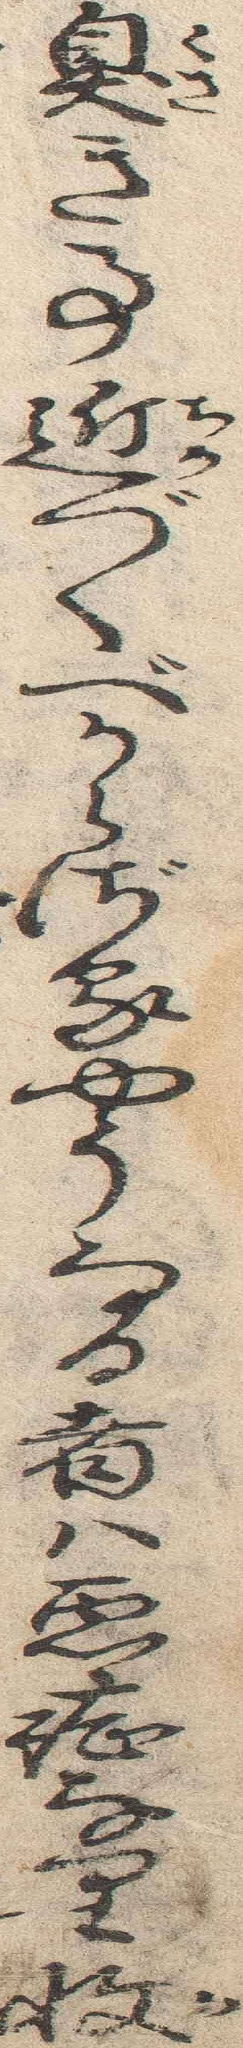臭き事近づくべからざるやうなる者は悪症なり収
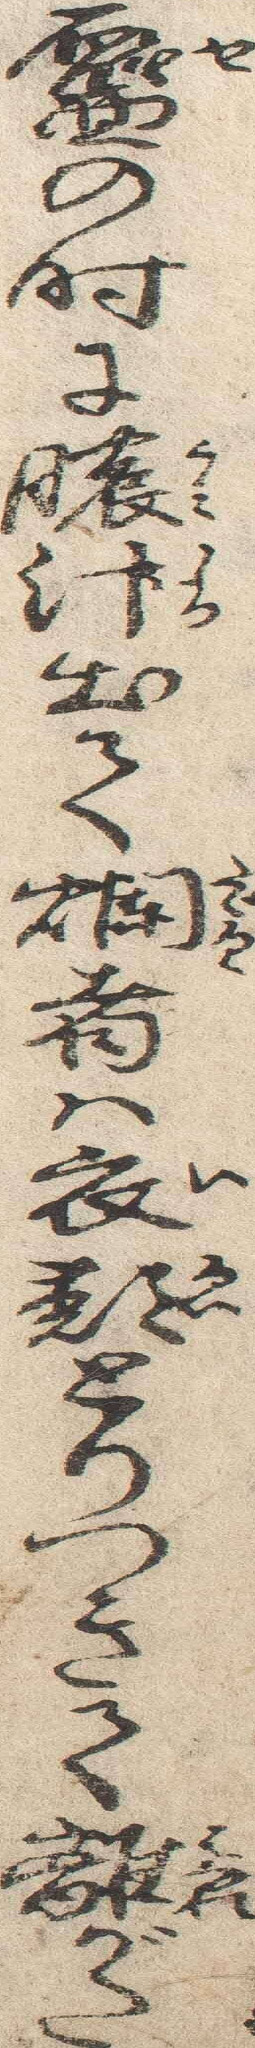靨の時に膿汁出て爛者は衣類とりつきて離がた
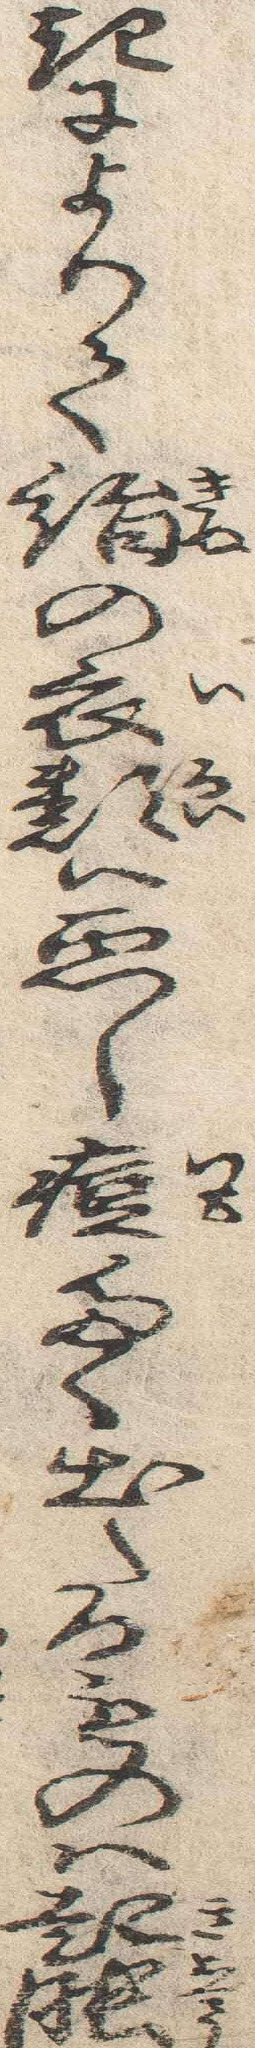きによりて絹の衣類は悪し痘多く出たるものは起脹
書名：小児必用養育草
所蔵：東京学芸大学附属図書館 国文学研究資料館
